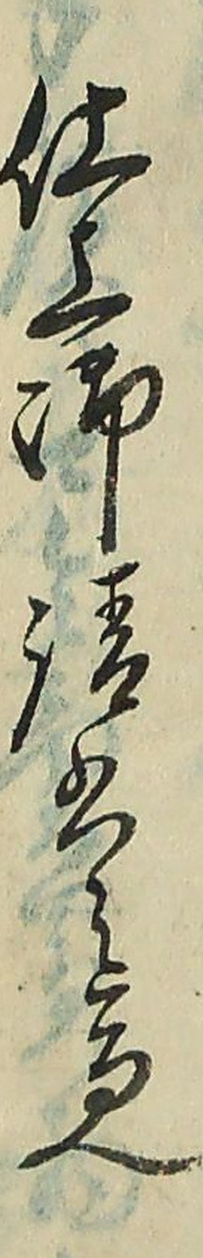仕上御請書之覚
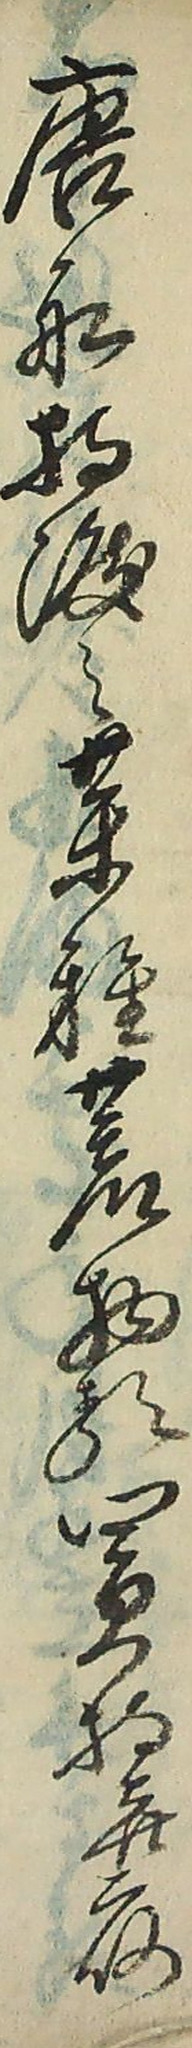唐舟持渡之菜種荒物類買持幷荷
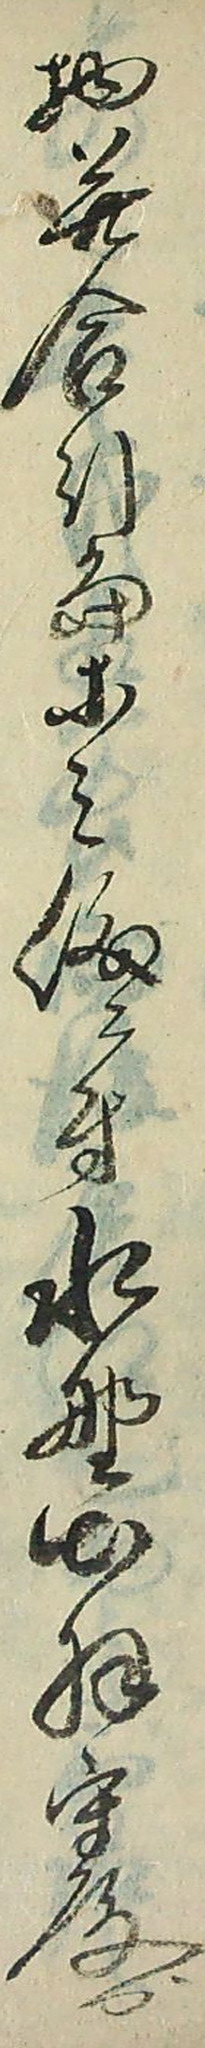物幷合引当等之義に付水野出羽守殿ゟ
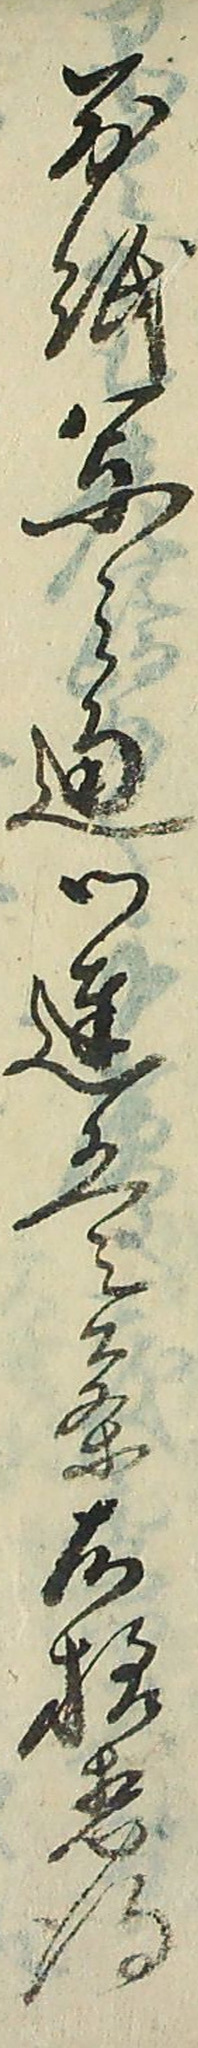別紙写之通御達有之候条左様相心得
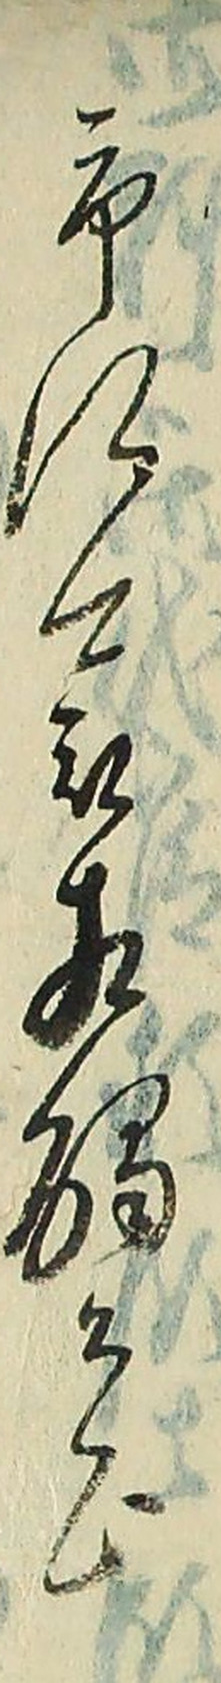市郷可被相触候以上
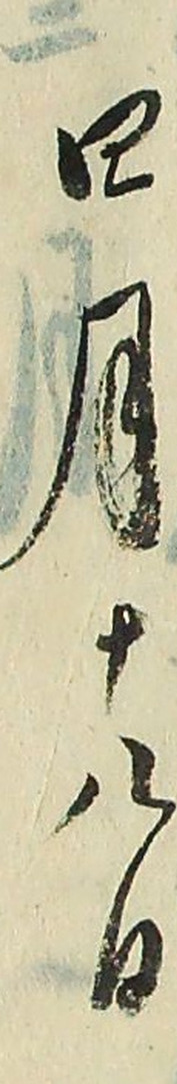四月十八日
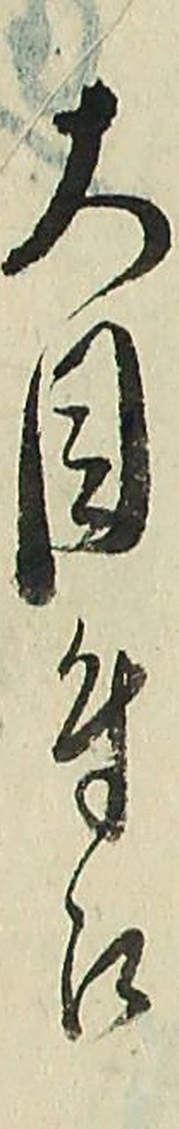大目付江

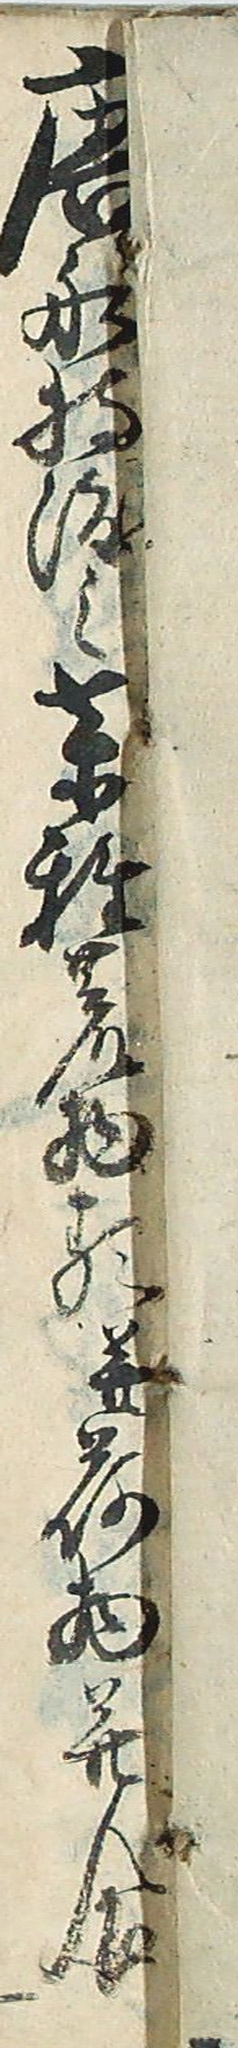唐船持渡之薬種荒物類幷荷物並合
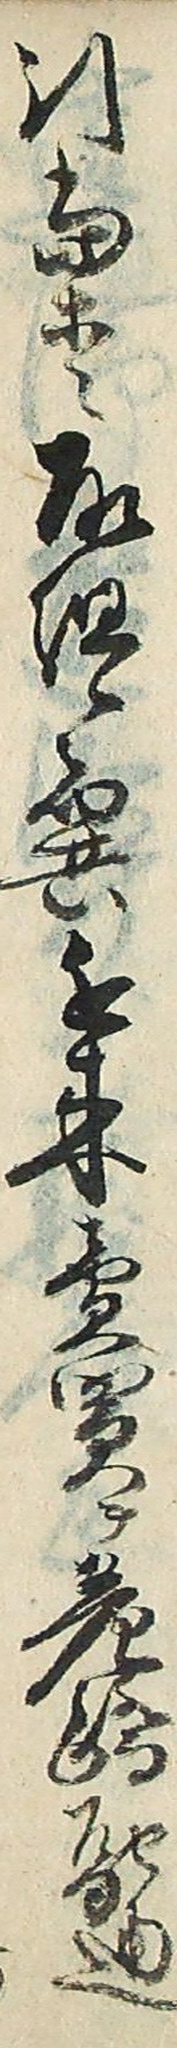引当等に取組候者共近来売買を危踏融通
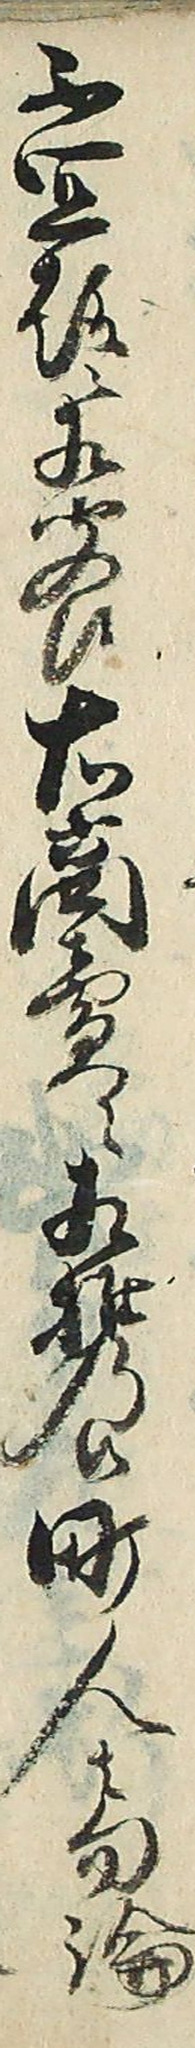不宜趣に相聞候右商売に相携候町人者勿論
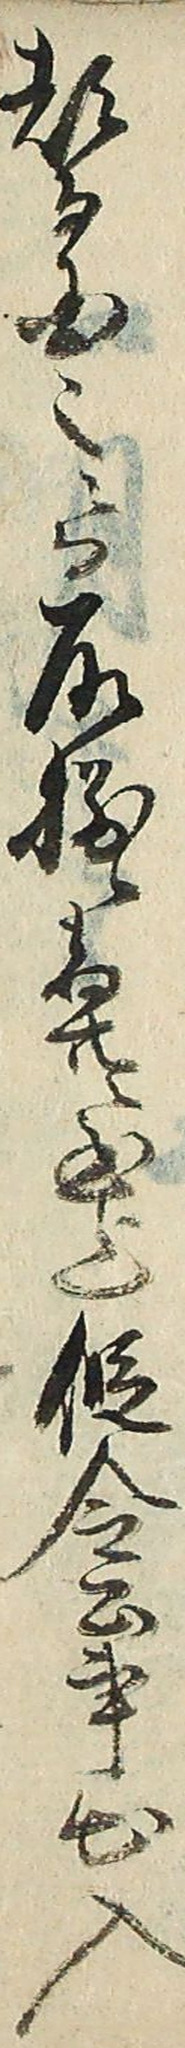都而国々に而取捌候者共に至迄仮令公事出入
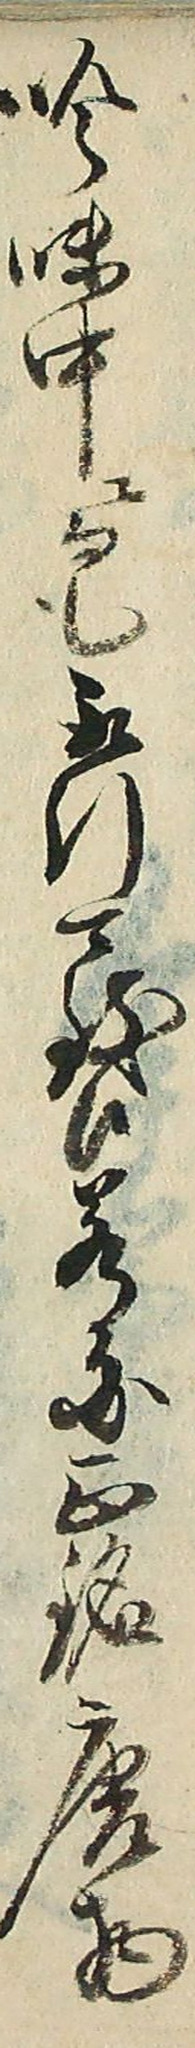吟味中に而も取引可致候若亦正銘唐物
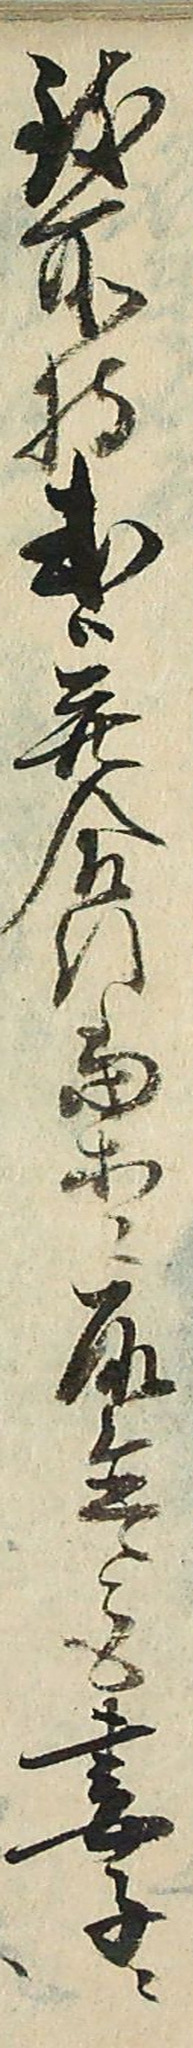致所持或は並合引当等に取置候ても妻子に
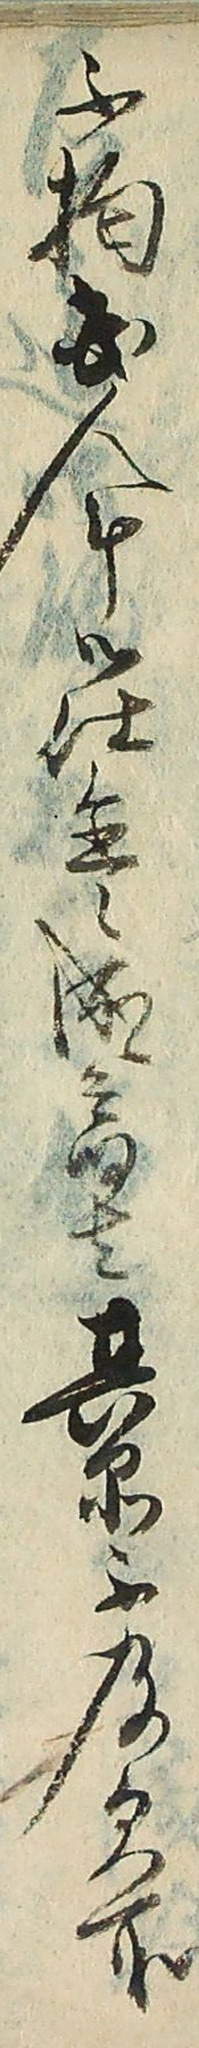不拘当人計御仕置に成候節者其品不及欠所
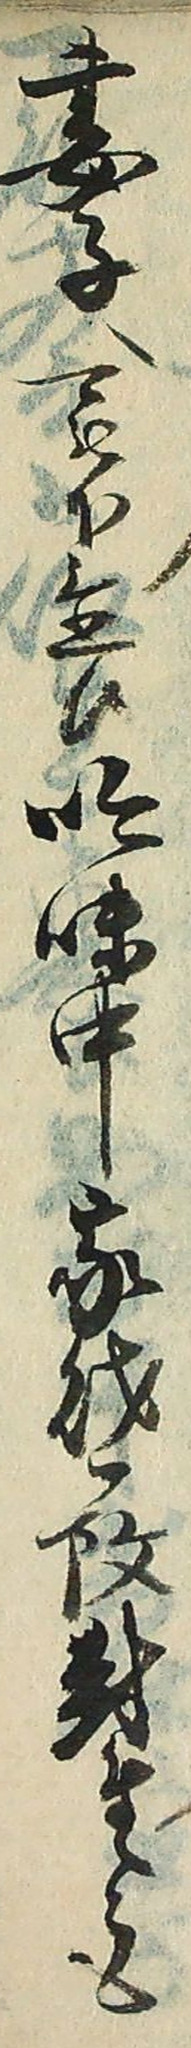妻子へ可被下置候吟味中家財を改封付候とも
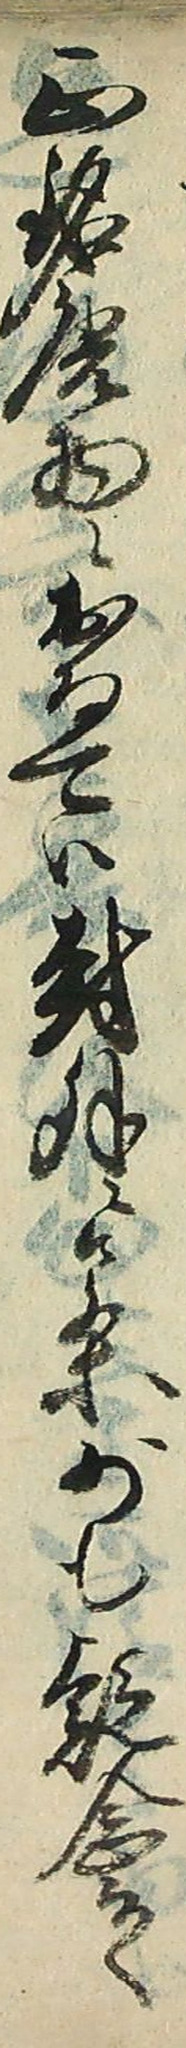正銘唐物におゐては封外に候条少も疑念なく
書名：諸御用御□受書控
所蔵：鳴門教育大学 Naruto University of Education
